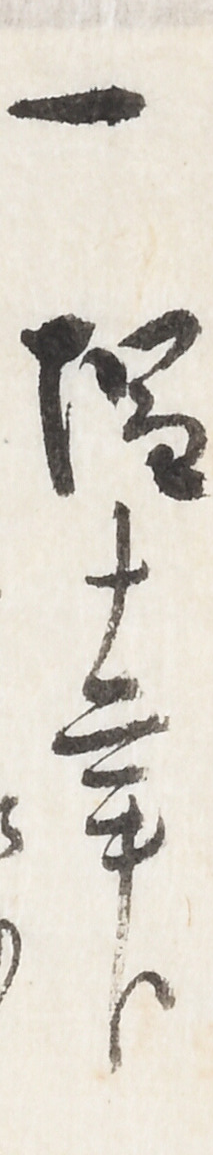一塩十二升
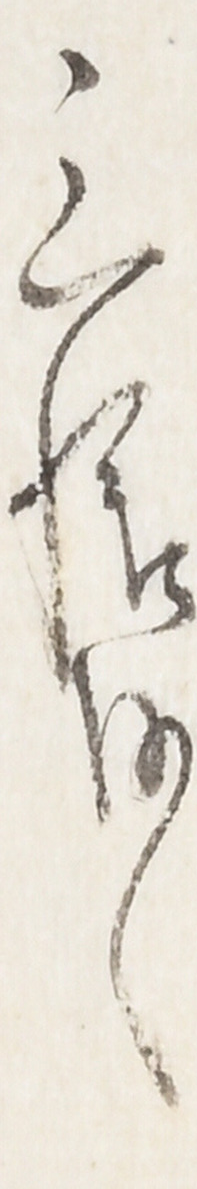三拾弐文
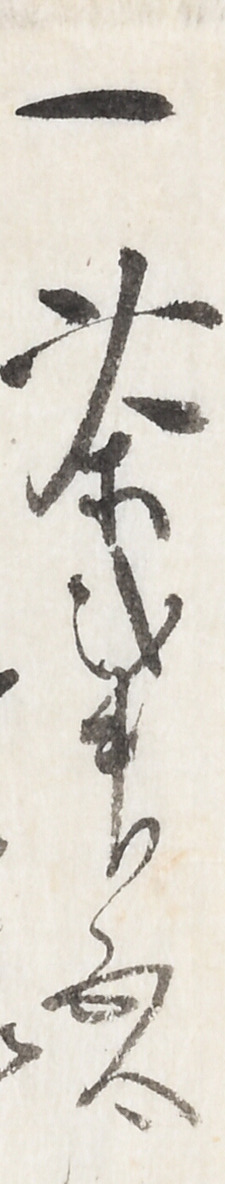一茶弐升五合
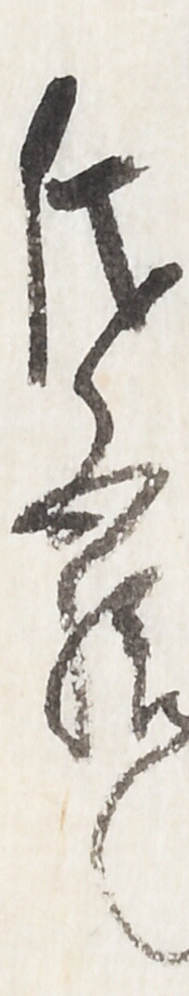代五拾文
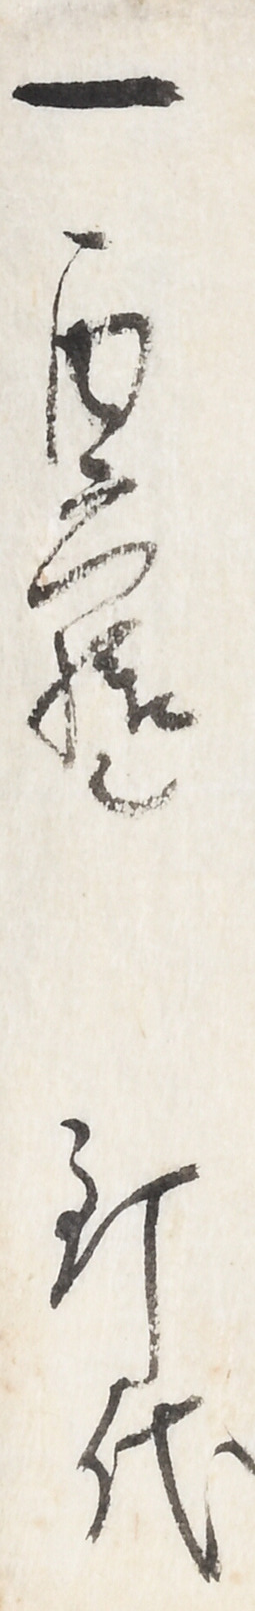一百六拾文釘代

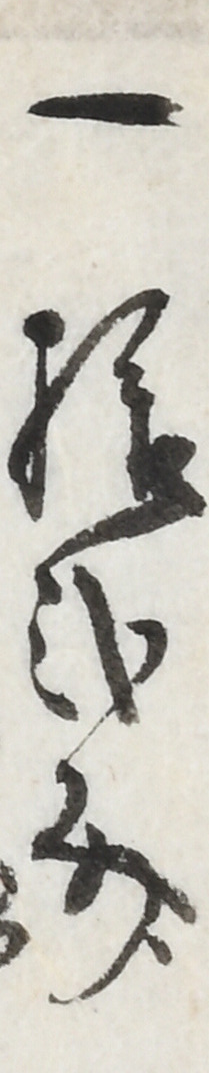一拾弐文
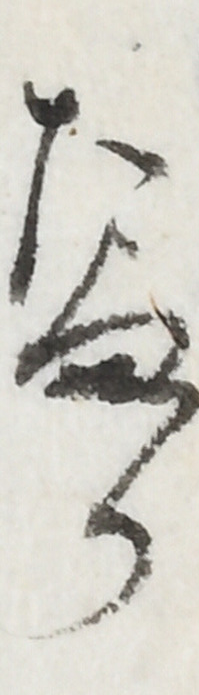たまり
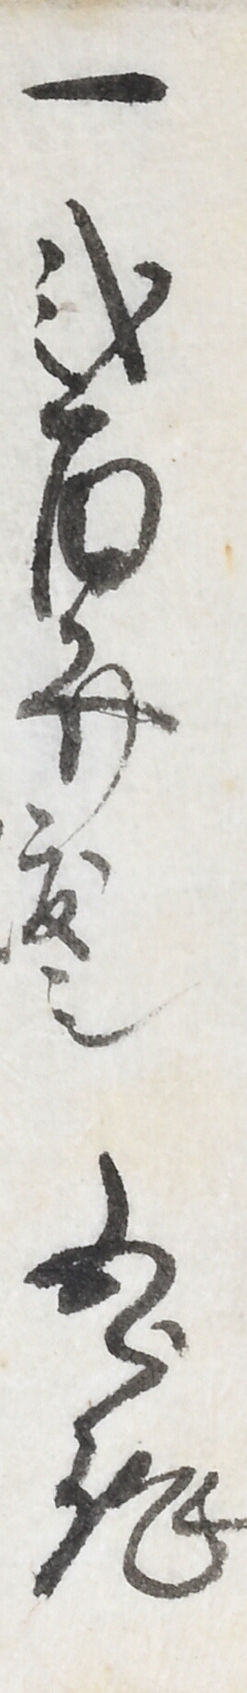一弐百文渡し五郎作
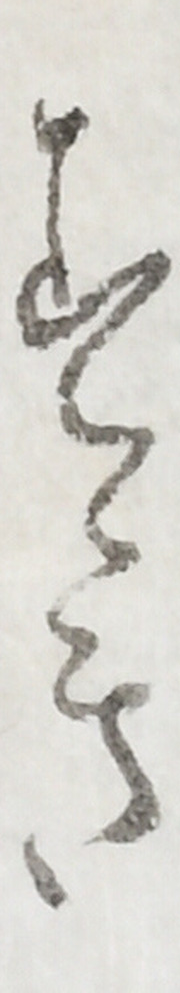すゝき
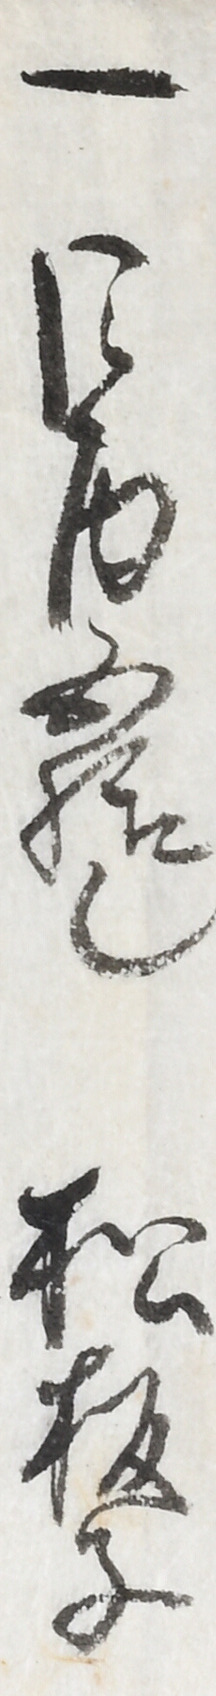一四百五拾文松板子
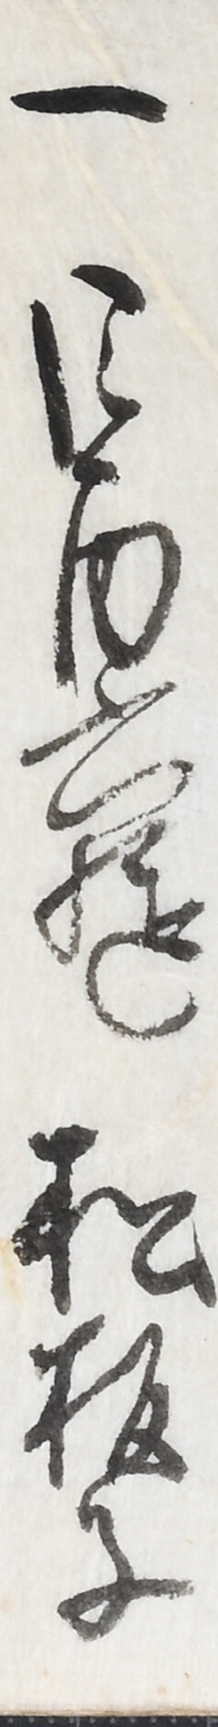一四百六拾文松板子
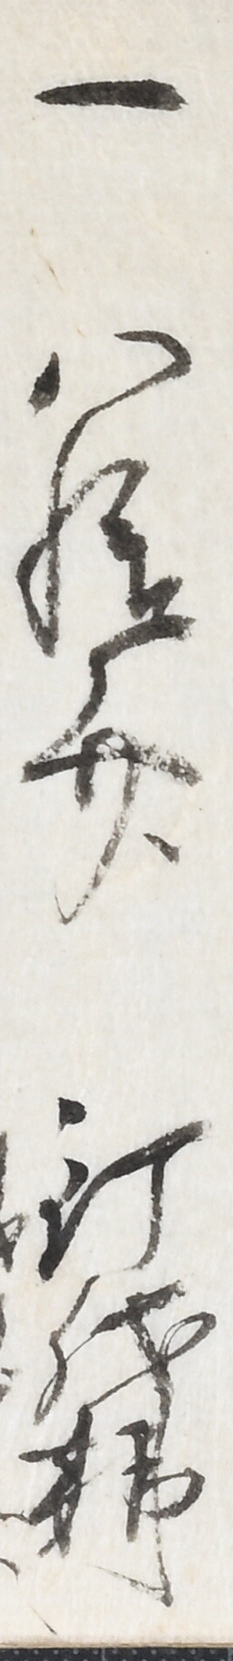一八拾文釘代払
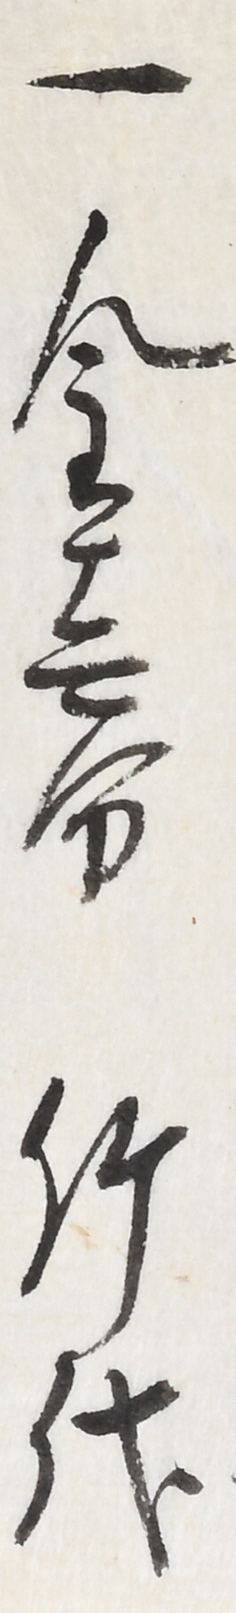一金壱分竹代
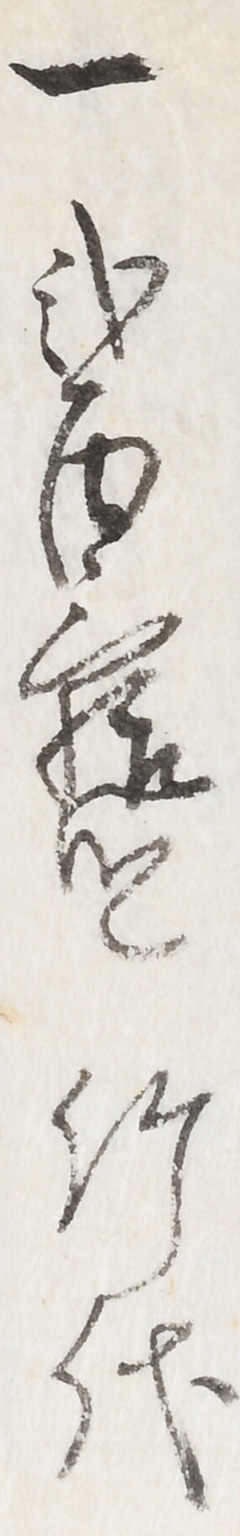一弐百三拾弐文竹代
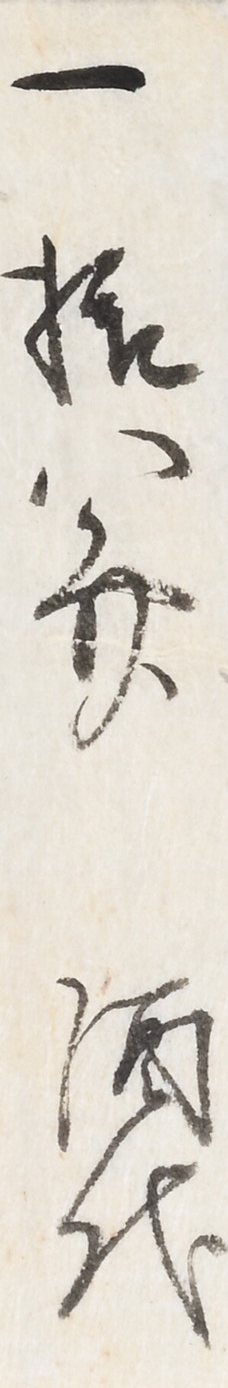一拾八文酒代
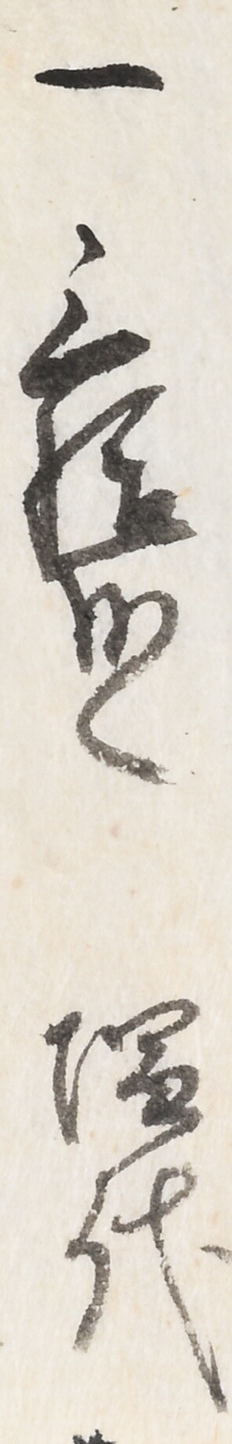一三拾弐文塩代
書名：合力覚帳
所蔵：伊那市立高遠町図書館・合同会社AMANE
